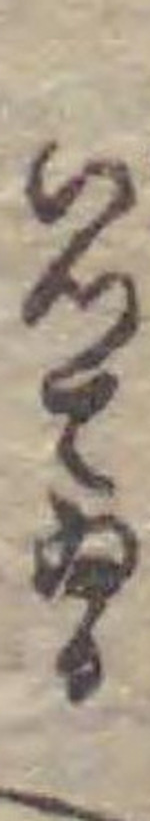いつてゐる
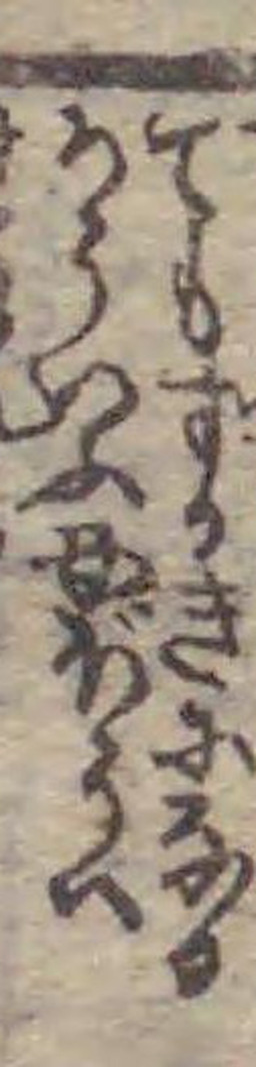かういふ女ぼうは
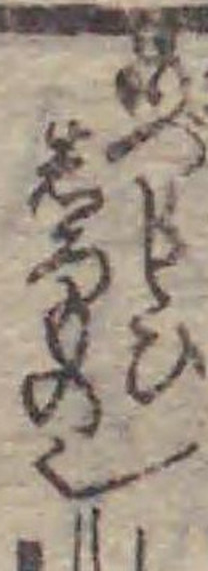しろもの也
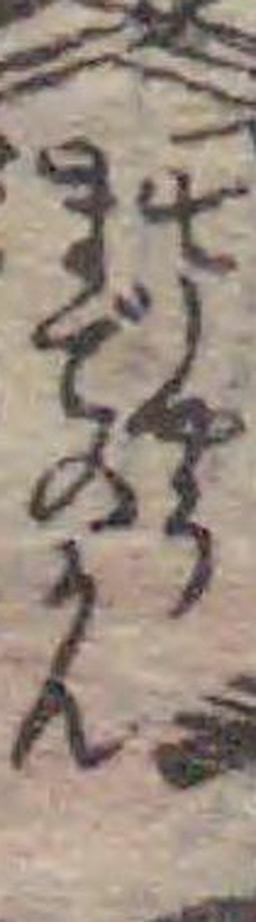までのかん
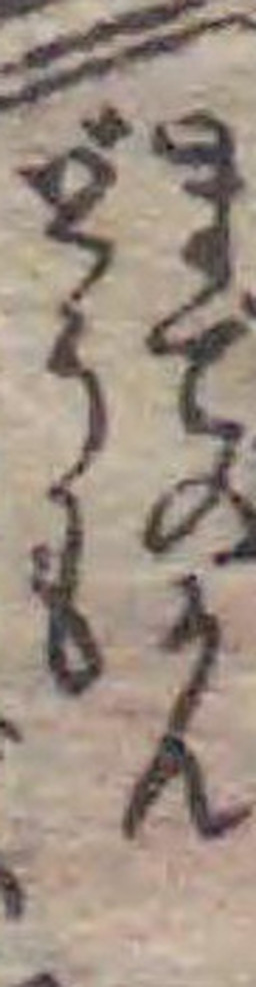どうも
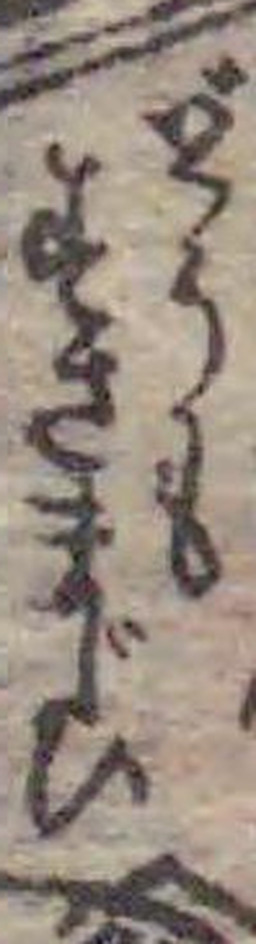すさまじひ
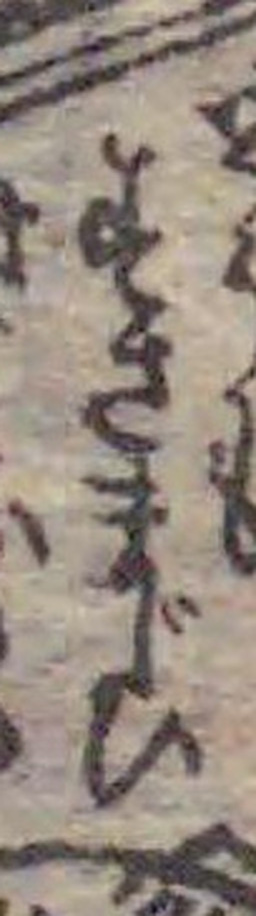すさまじひ
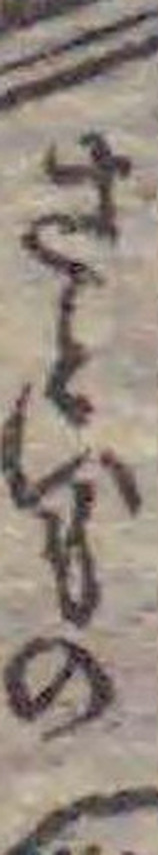さといもの
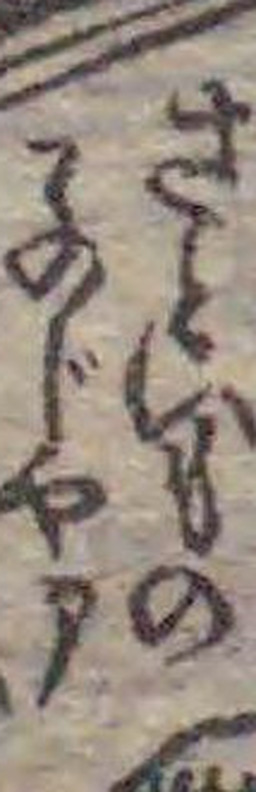子じやァ
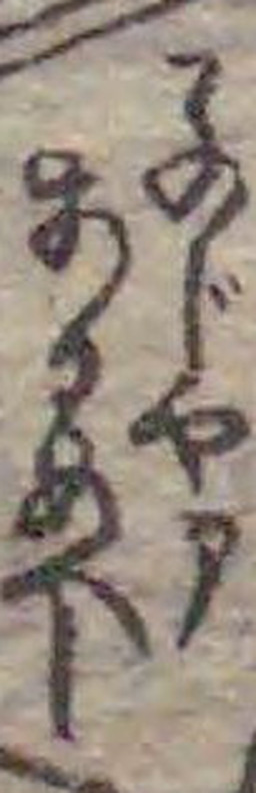あるめへし
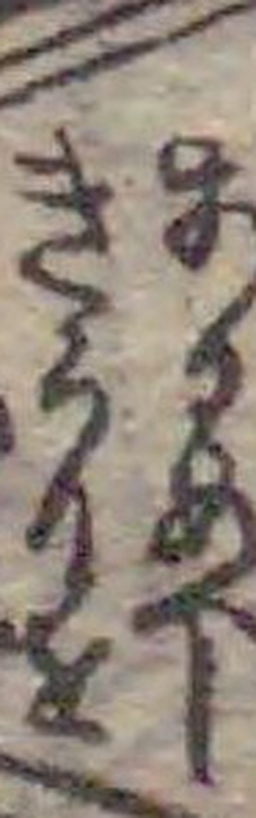きうりを
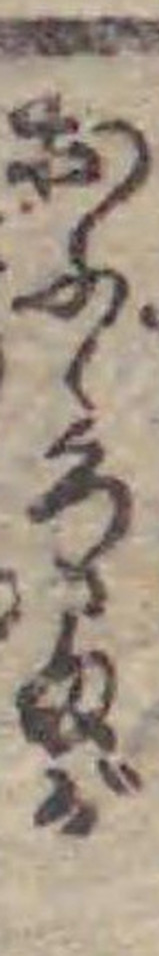おふくろさまが
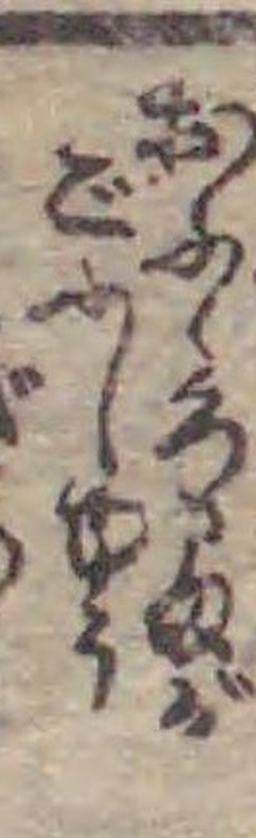ごふしゆう
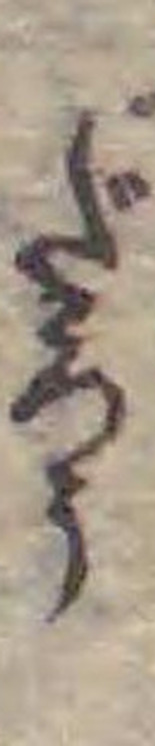だろう
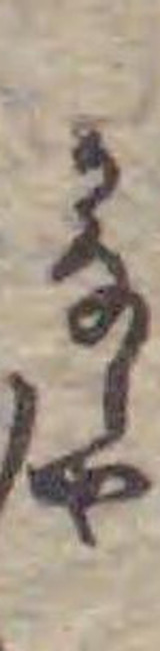かなしや

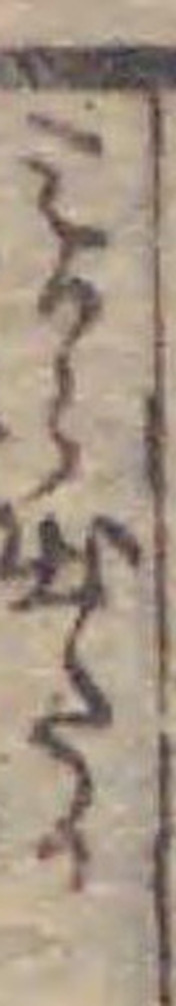みから出たる
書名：四遍搨心学草帋 : 3巻
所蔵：国立国会図書館 National Diet Library, JAPAN
